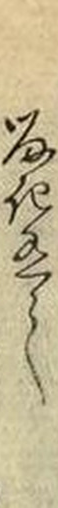留記有之
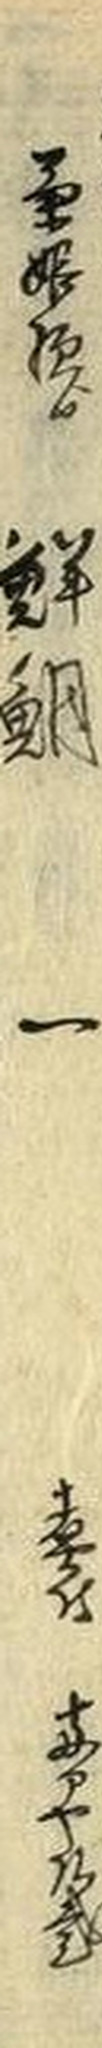菊姫様ゟ鮮鯛一煮付両部や頂戴
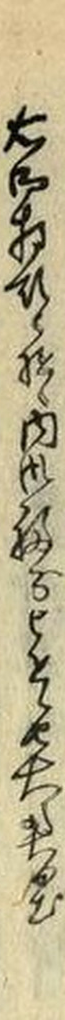右御拝領被遊候内御福分被進候由大奥ゟ出
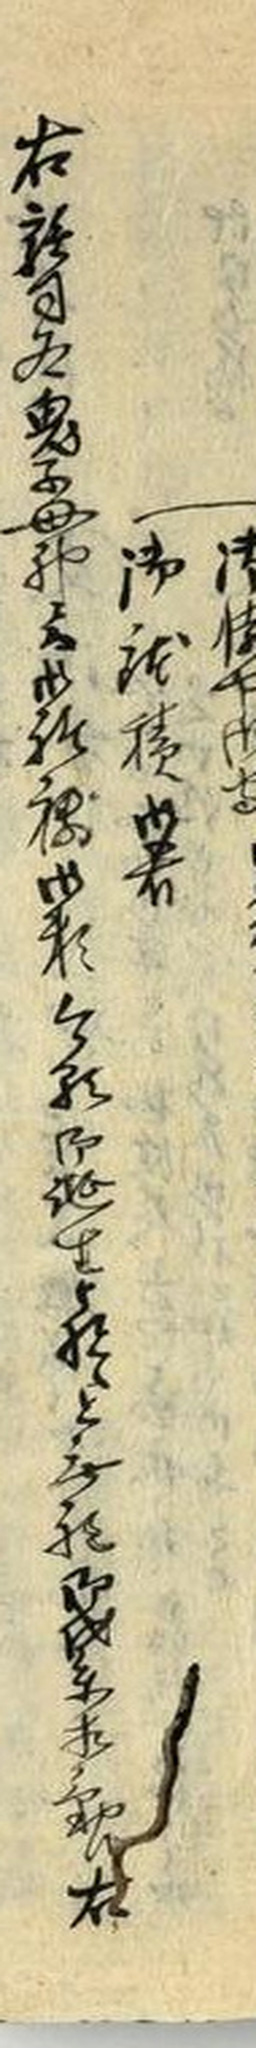右雑司谷鬼子母神ニ而御祈祷御頼今朝御誕生被遊候と無程御代参相勤候右
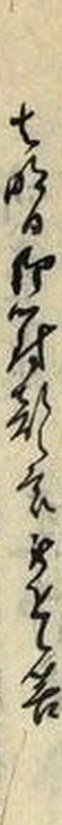は明日御対顔之節被進候筈
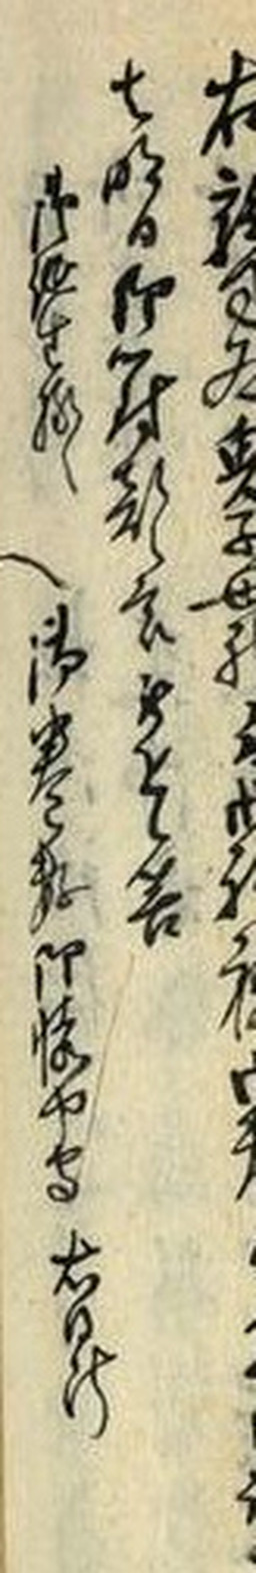御誕生様へ御巻数御懐中守右同断
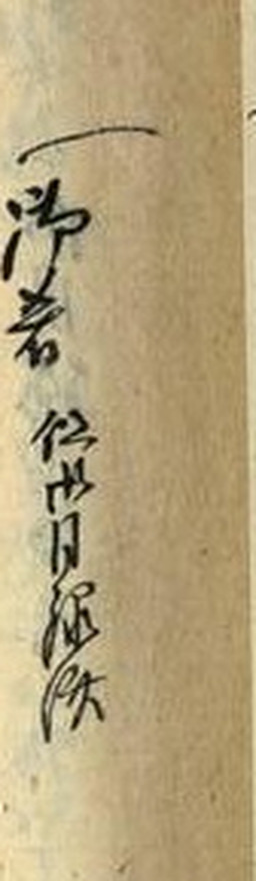御肴但御目録済
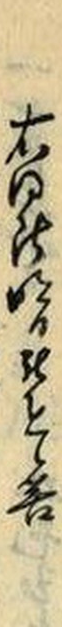右同断明日被進之候筈
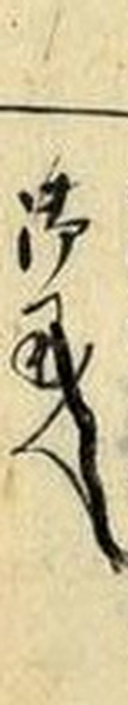御役人
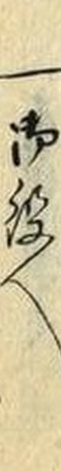御役人
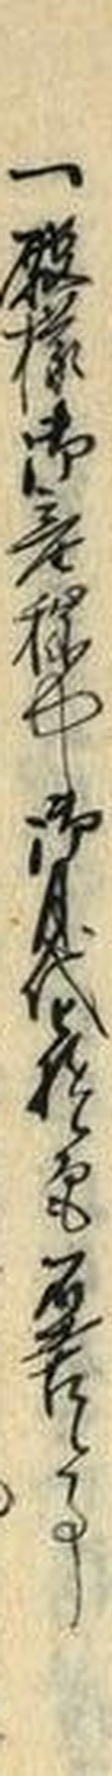一殿様御産穢中御月代被遊候而も不苦候事
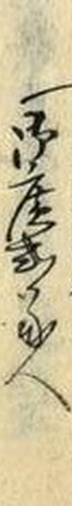御広敷御用人
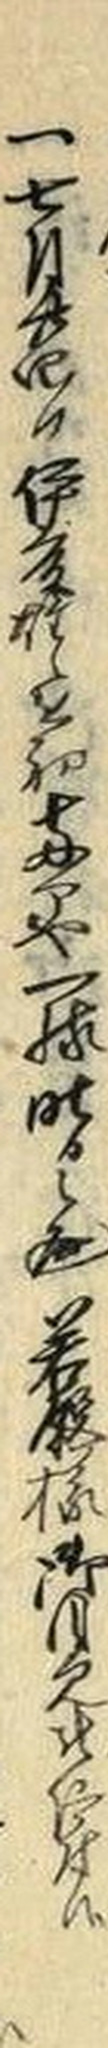一七月廿四日伊藤雄之進初両部や一統昨日之通若殿様御目見被仰付候
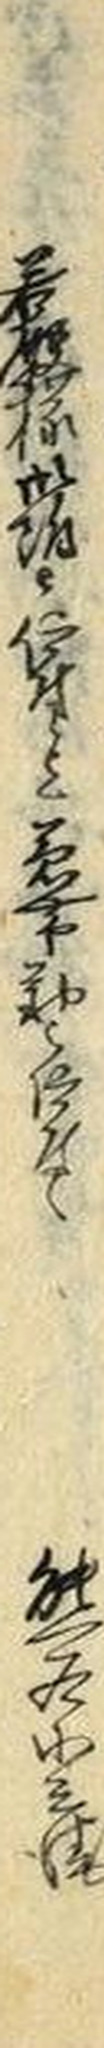若殿様御附被仰付候迄兼帯勤被仰付候熊谷小兵衛
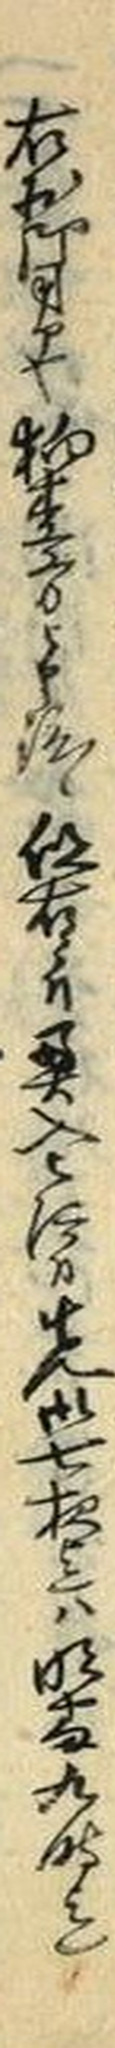右於御用部や狛木工方被申渡候但右ニ付奥入被仰付先御七夜迄ハ明番九時迄
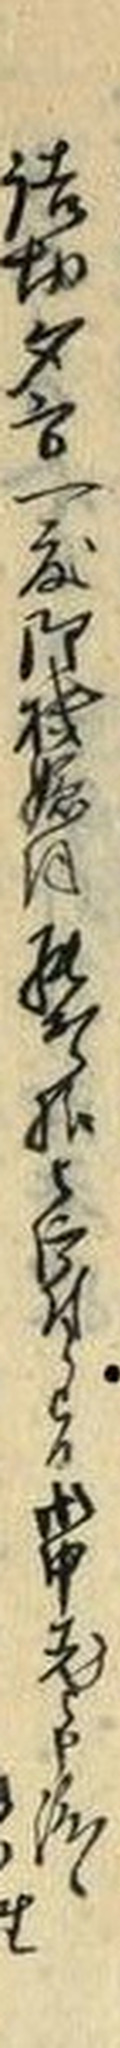詰切夕方一度御機嫌伺罷出候様被仰付候ニ付御中老被申渡候
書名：少傅日録抄（斉承付側向頭取日記、在府）
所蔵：福井県文書館 Fukui Prefectural Archives
